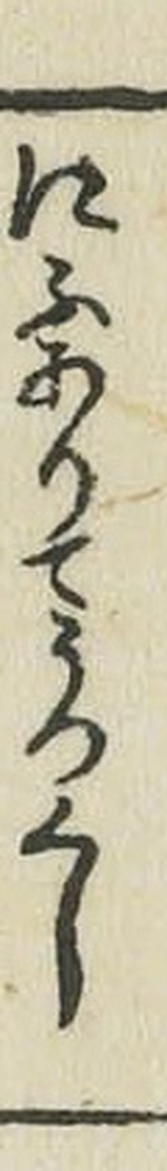にふありてうつくし
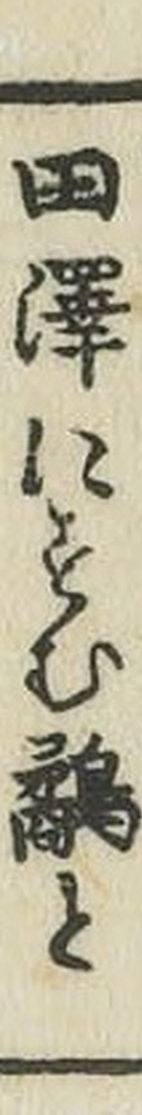田沢にすむ鷸と
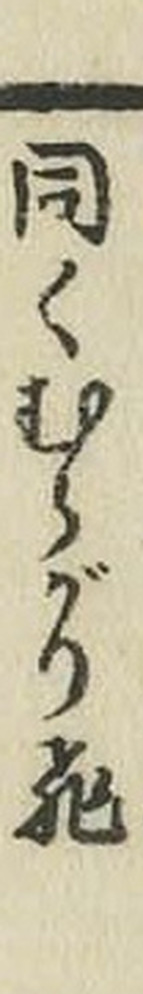同くむらがり飛
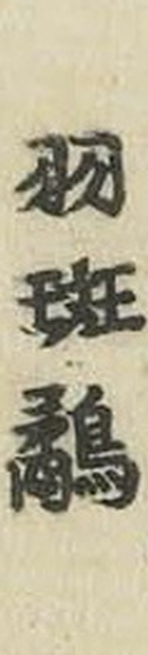羽斑鷸
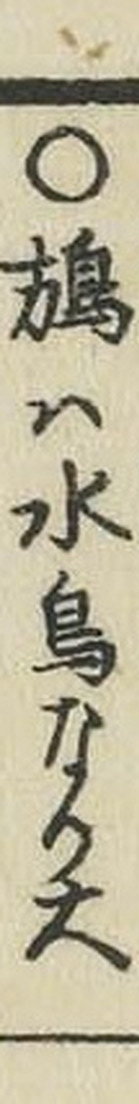○鴋は水鳥なり大
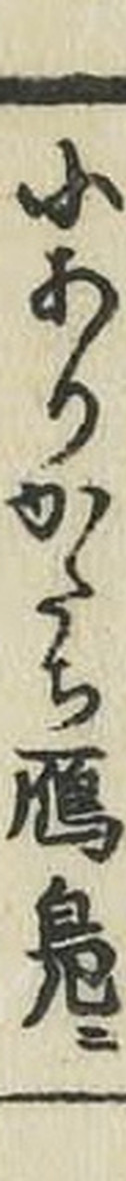小ありかたち鴈鳧に
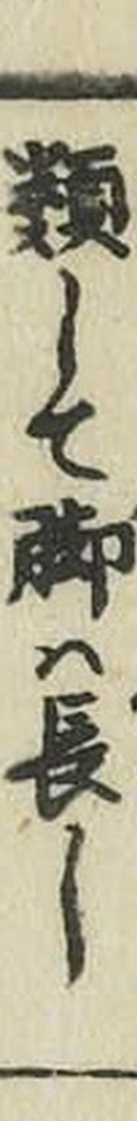類して脚は長し
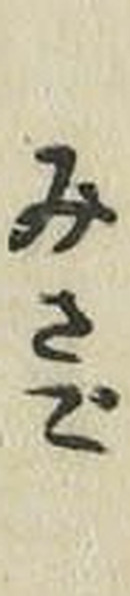みさご

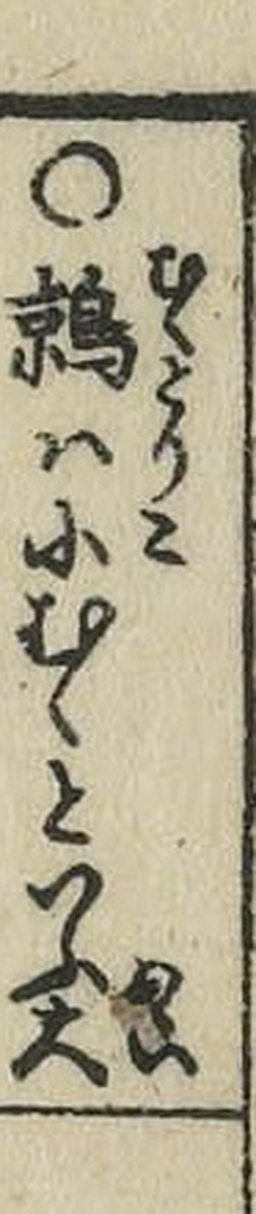○鶁は小むくといふ大
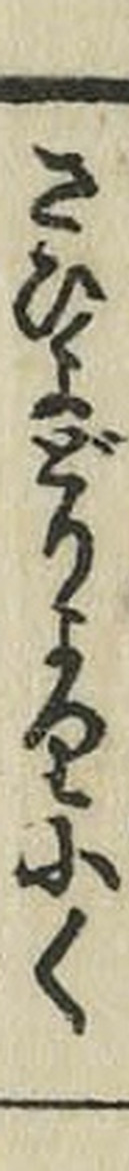さひよどりより小く
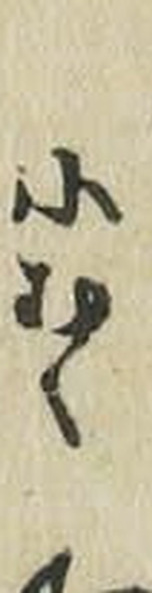小むく
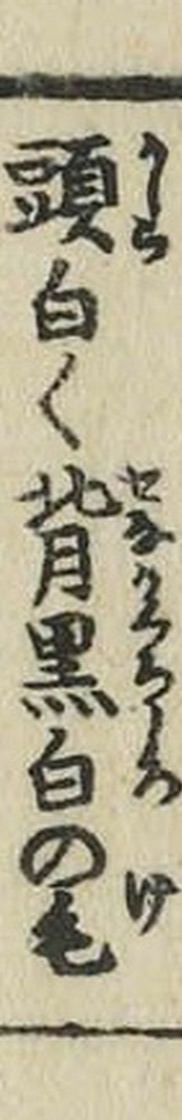頭白く背黒白の毛
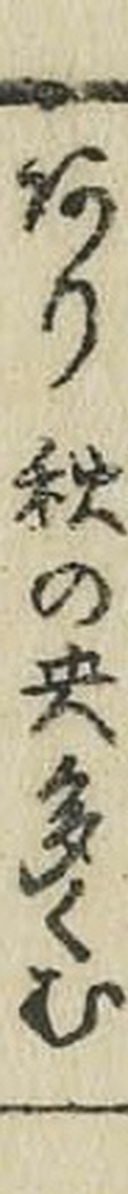あり秋の央多くむ
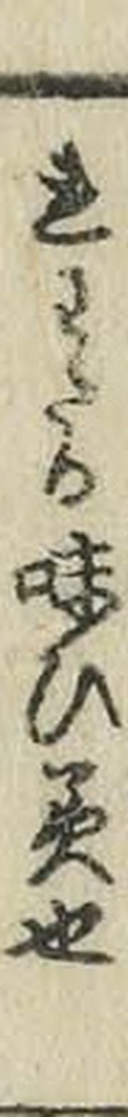れわたる味ひ美なり
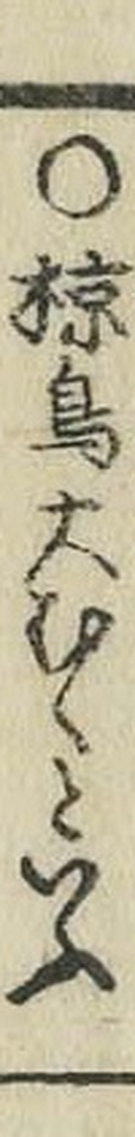○椋鳥大むくといふ
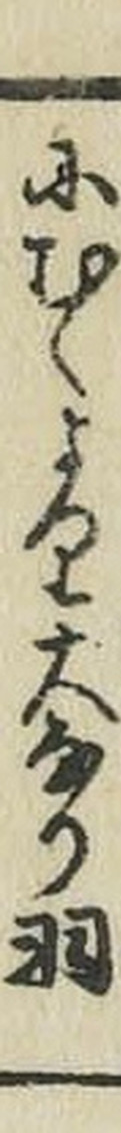小むくより大なり羽
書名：増補頭書訓蒙図彙大成 10巻 6:巻之12-13
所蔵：東京学芸大学教育コンテンツアーカイブ
